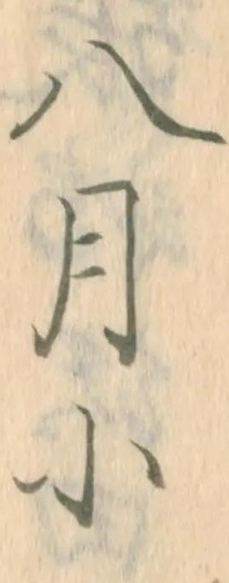八月小
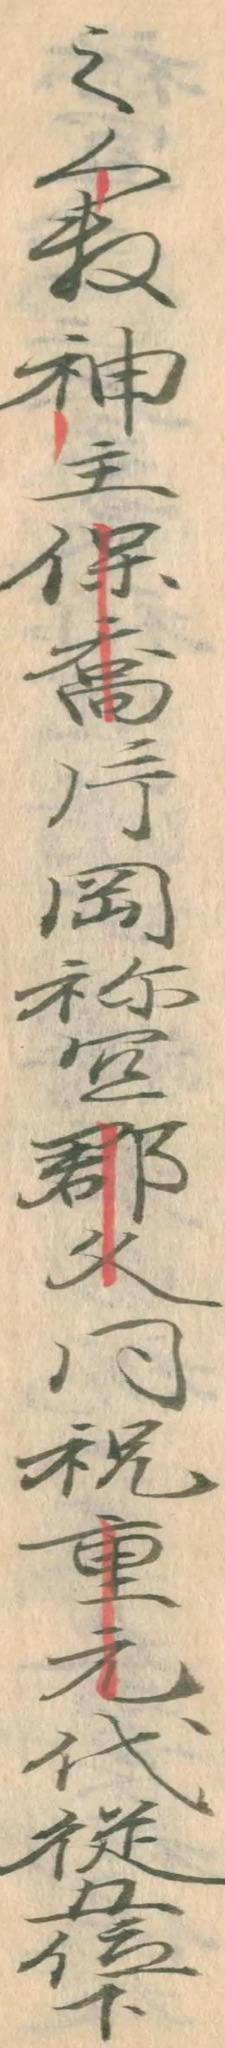之人-数神_主保喬片岡祢宜郡久同祝重元代従五位下
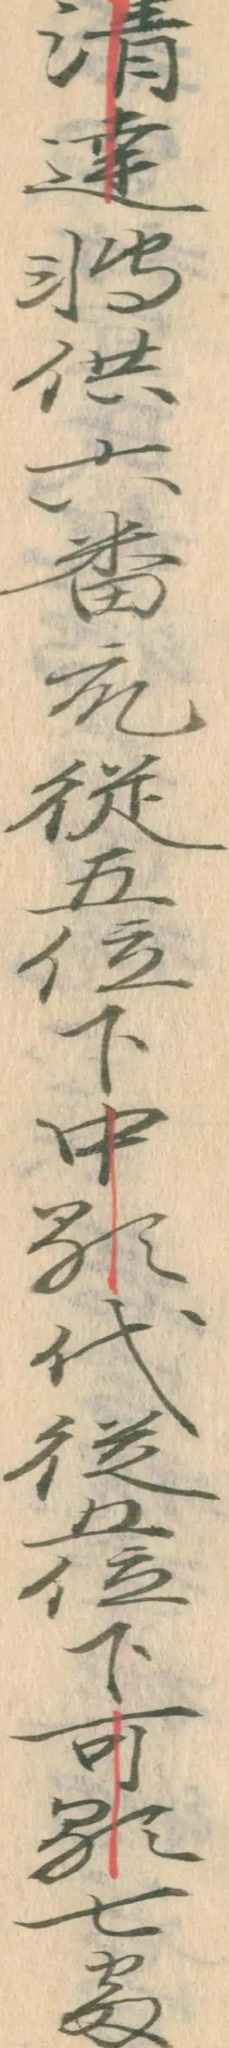清達転供六番衆従五位下中顕代従五使下可顕七番
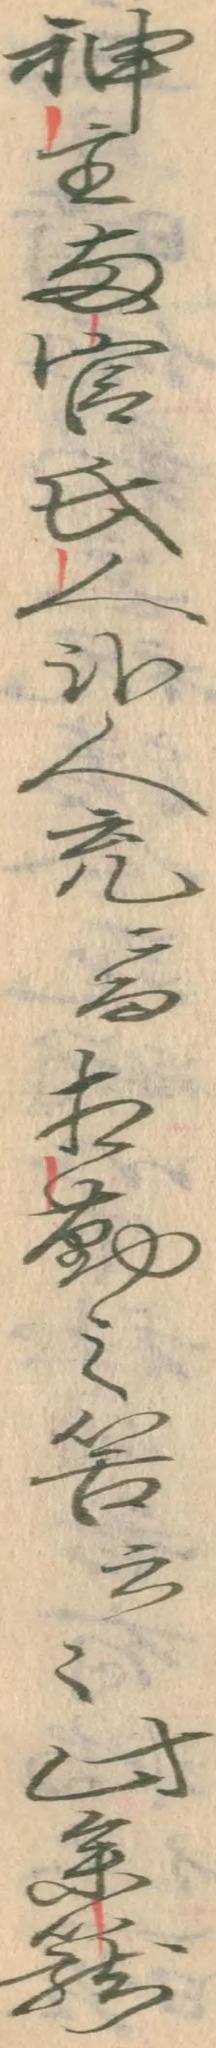神_主両-官氏弐人充ニ而相_勤之筈云々此参-籠
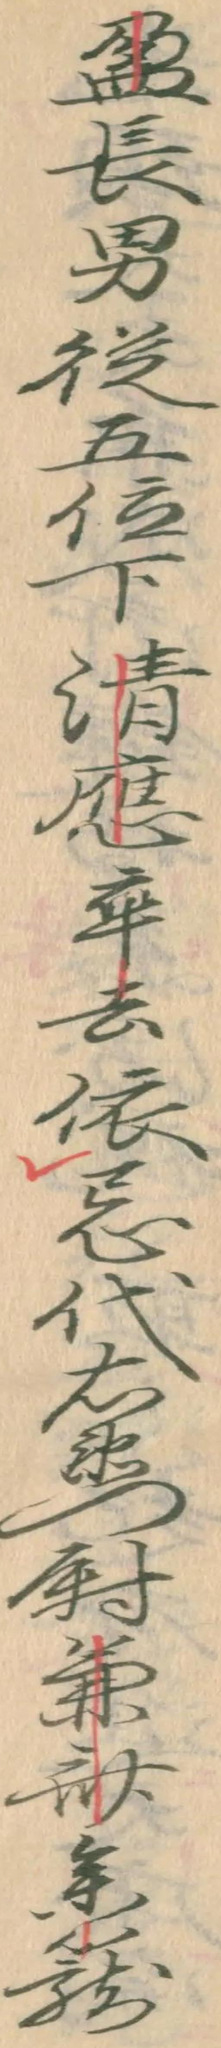盈長男従五位下清応卒-去依忌代右衛門尉兼斎参-籠
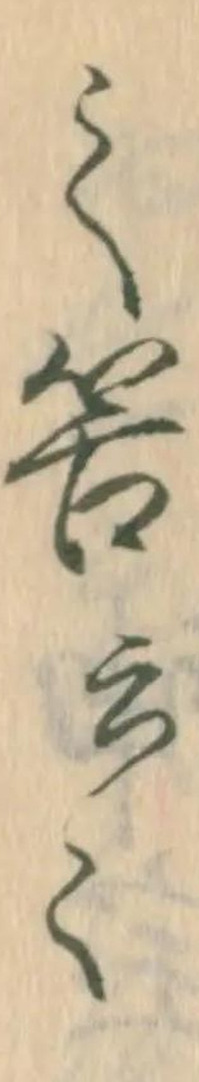之筈云々
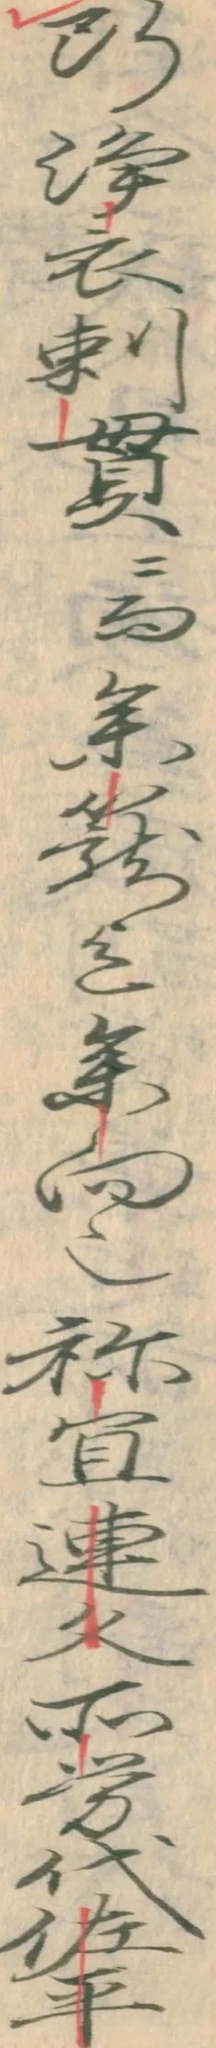断浄-衣刺_貫ニ而参-籠迄参-向也祢-宜連久所-労代佐平
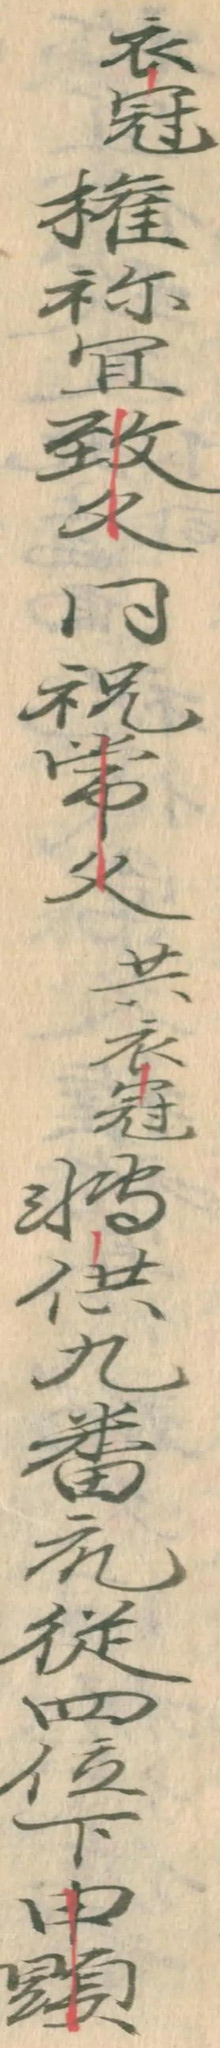衣-冠権祢宜致久同祝常久共衣-冠転-供九番衆従四位下由顕
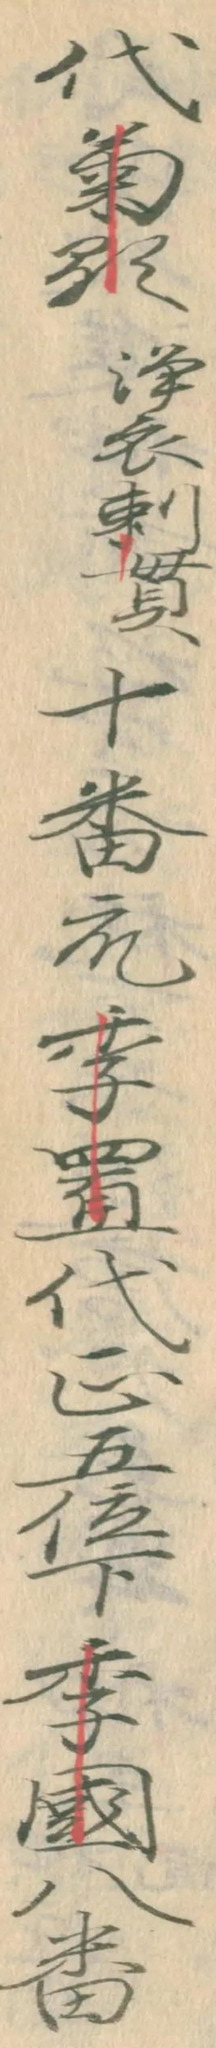代菊顕浄衣刺_貫十番衆季置代正五位下季国八番
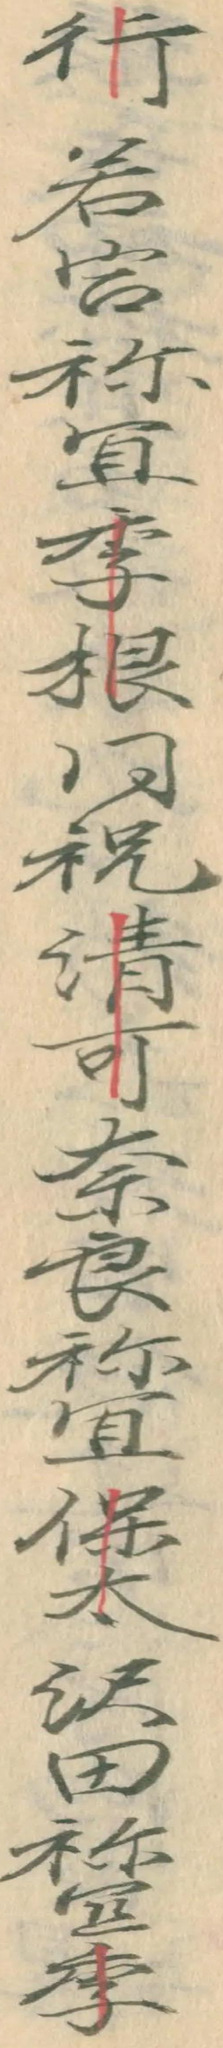行若宮祢宜李根同祝清可奈良祢宜保太沢田祢宜季

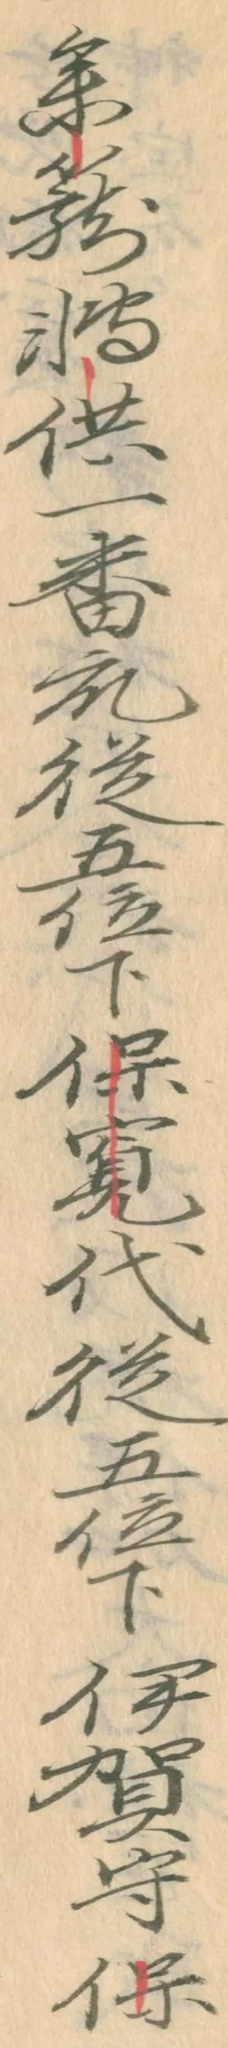参-籠転-供一番衆従五位下保寛代従五位下伊賀守保
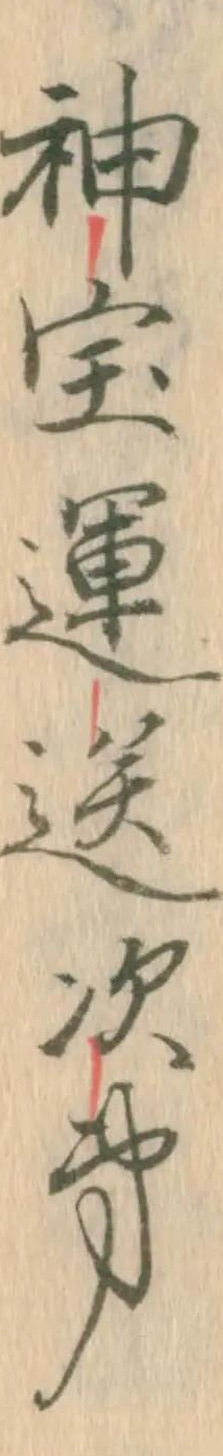神-宝運-送次-第

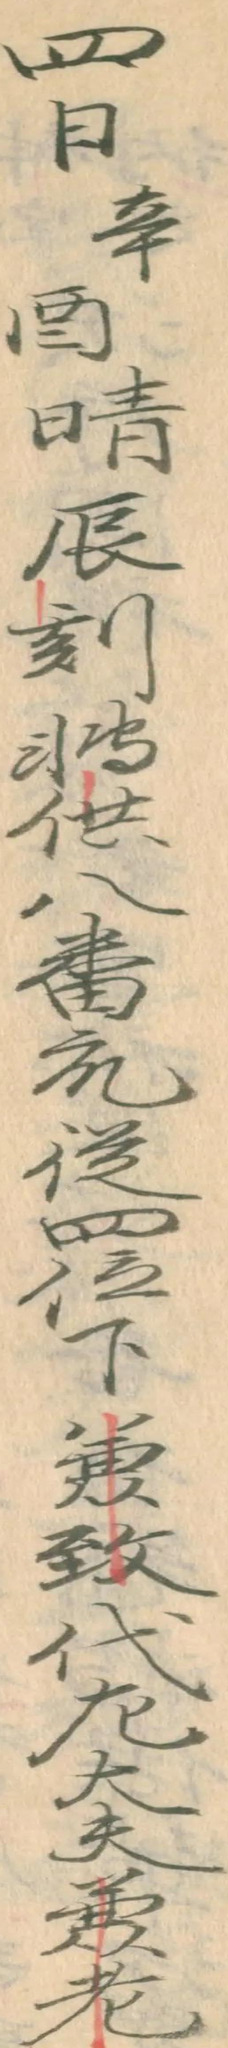四日辛酉晴辰_刻転-供八番衆従四位下兼致代左大夫兼老
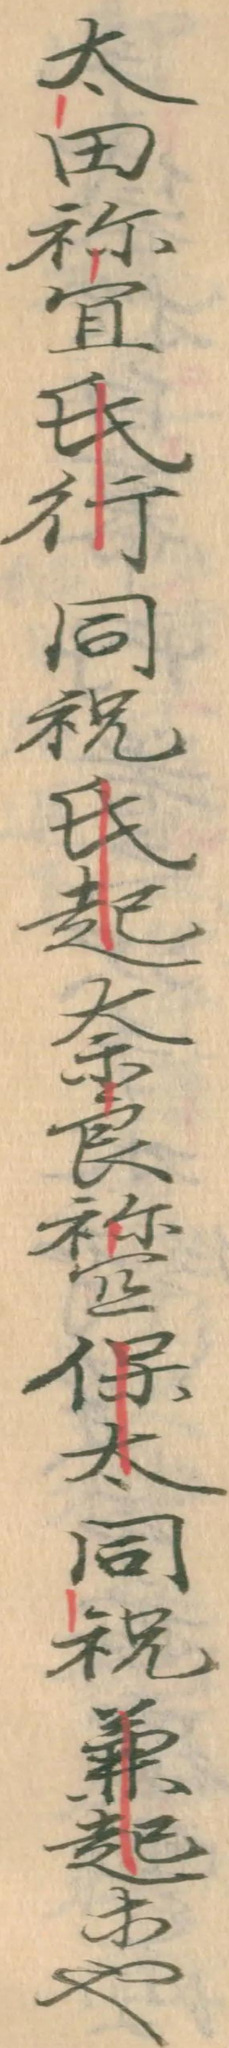太_田祢-宜氏行同祝氏起奈-良祢-宜保太同_祝兼起等也
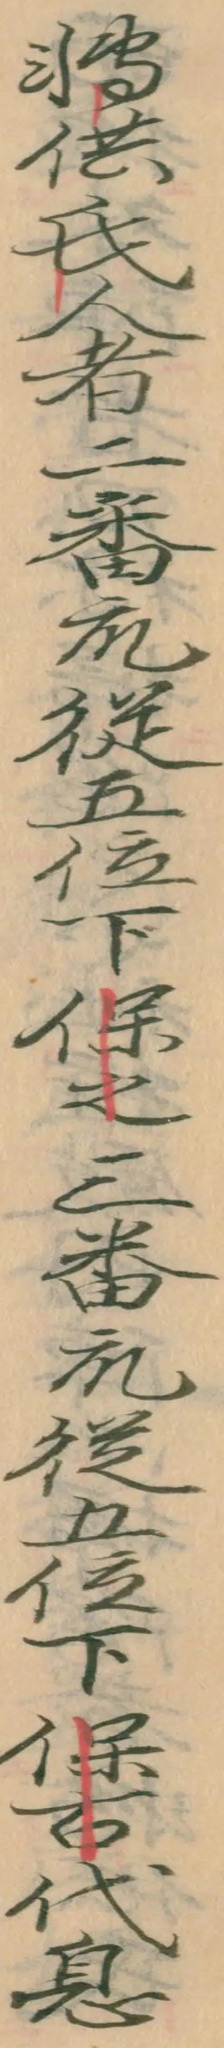転-供氏者二番衆従五位下保之三番衆徒五位下保古代息
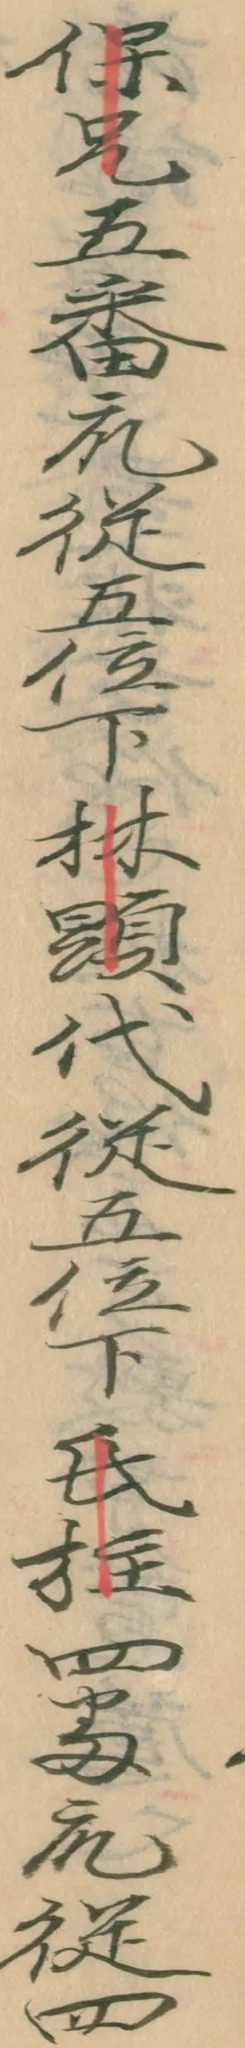保兄五番衆従五位下林顕代従五位下氏柱四番衆従四
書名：賀茂社記録. 第16冊
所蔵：国立国会図書館 National Diet Library, JAPAN
